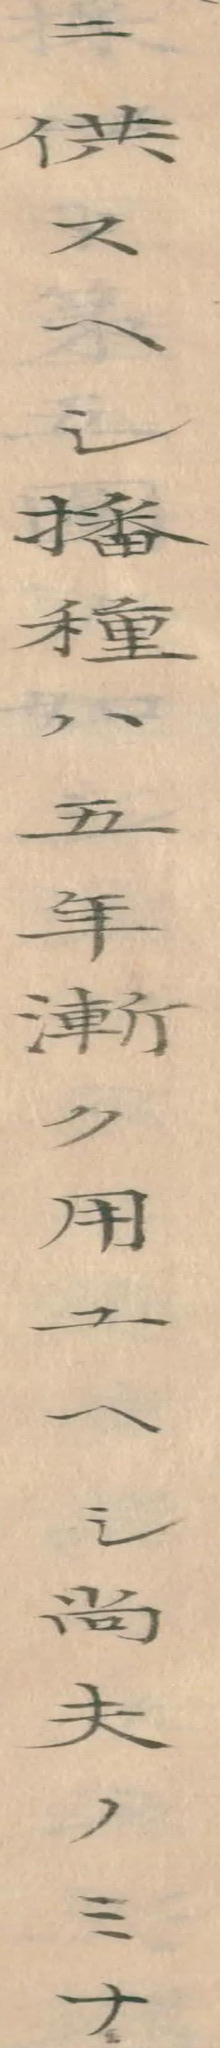ニ供スヘシ播種ハ五年漸ク用ユヘシ尚夫ノミナ
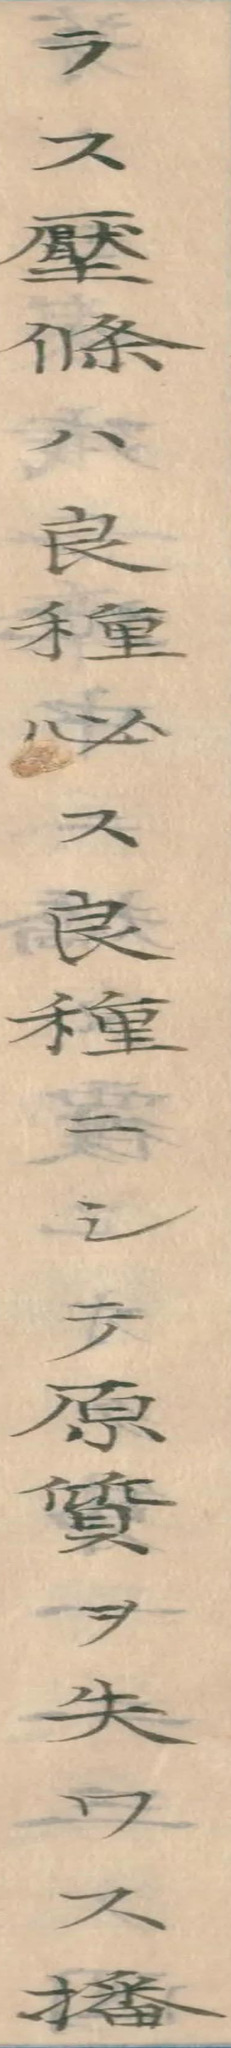ラス圧条ハ良種必ス良種ニシテ原質ヲ失ワス播
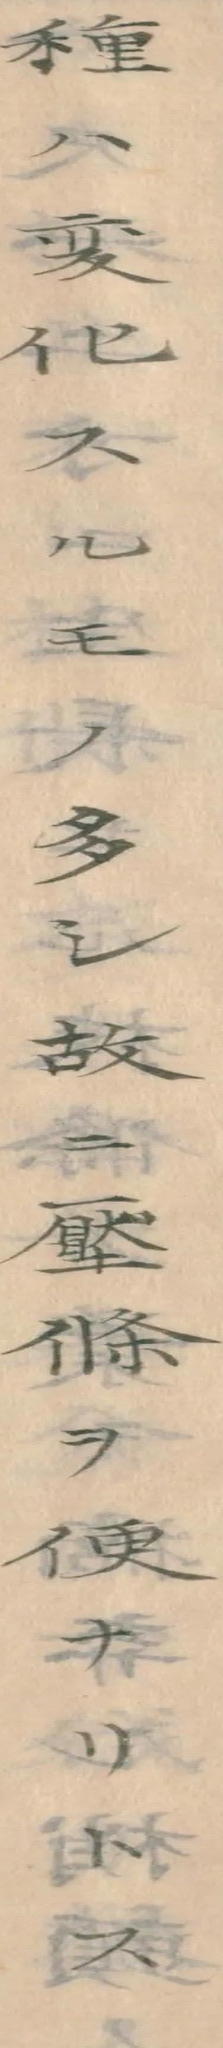種ハ変化スルモノ多シ故ニ圧条ヲ便ナリトス
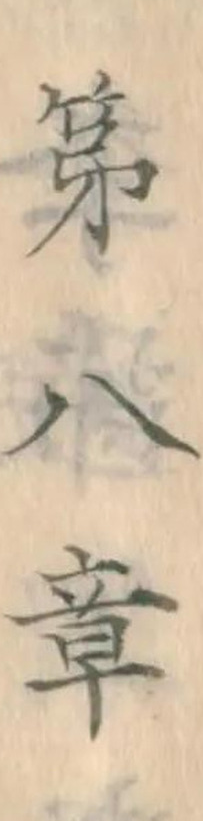第八章
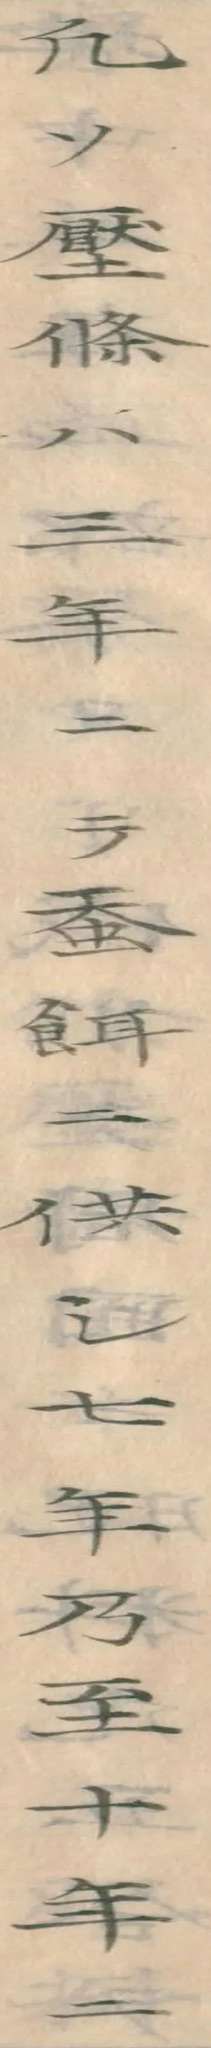凡ソ圧条ハ三年ニテ蚕餌ニ供シ七年乃至十年ニ
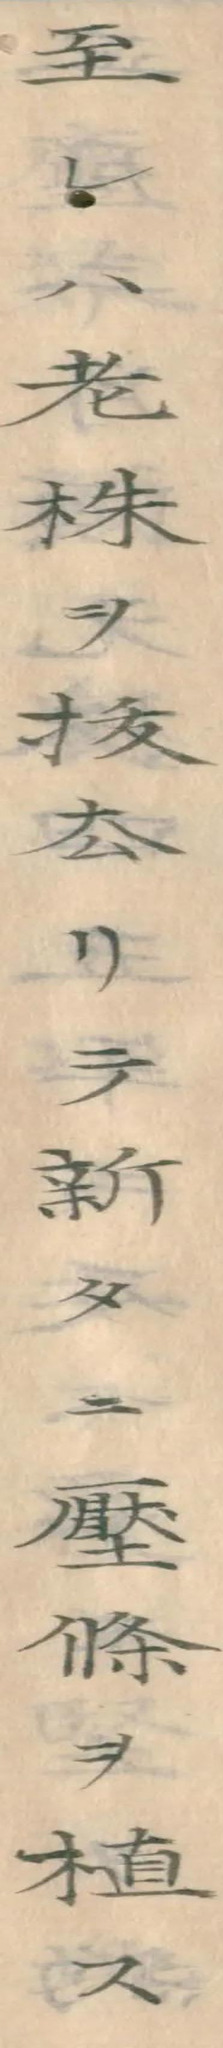至レハ老株ヲ抜去リテ新タニ圧条ヲ植ス
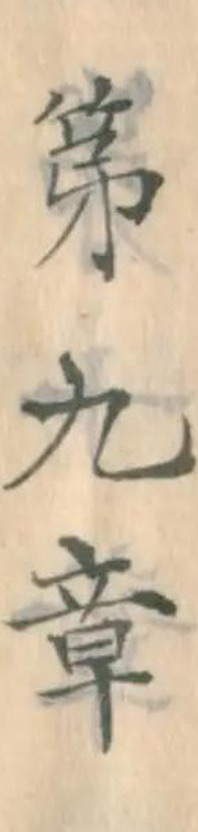第九章

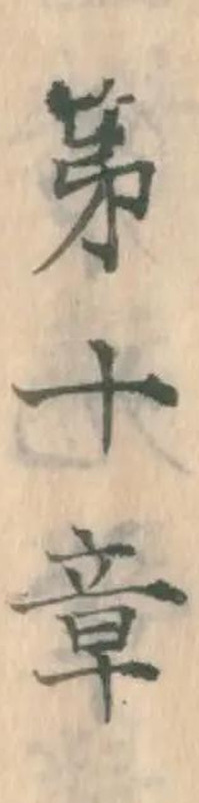第十章
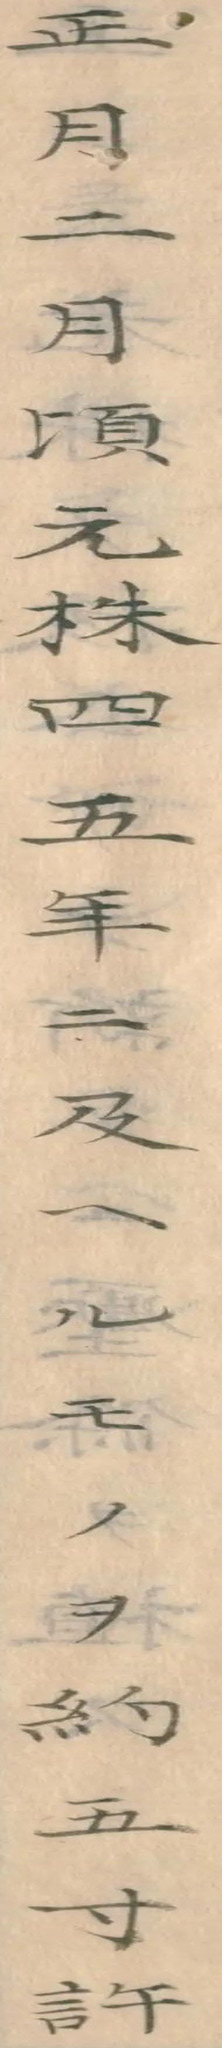正月二月頃元株四五年ニ及ヘルモノヲ約五寸許
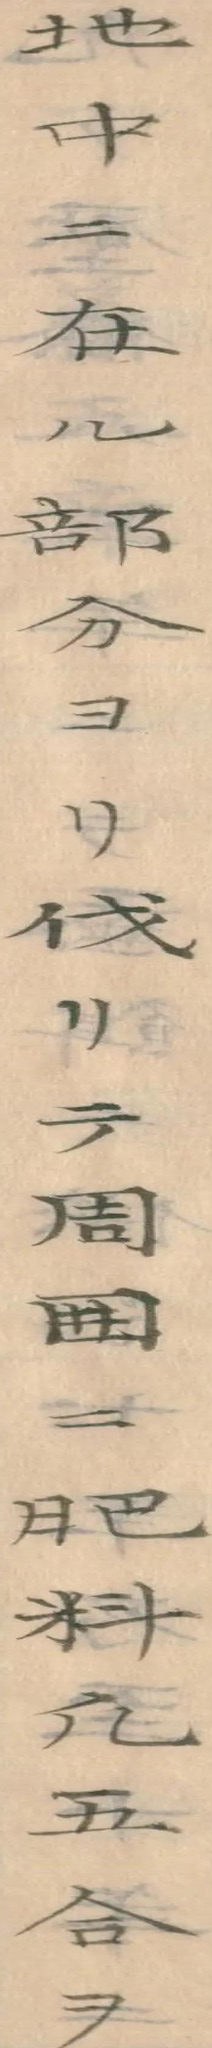地中ニ在ル部分ヨリ伐リテ周囲ニ肥料凡五合ヲ
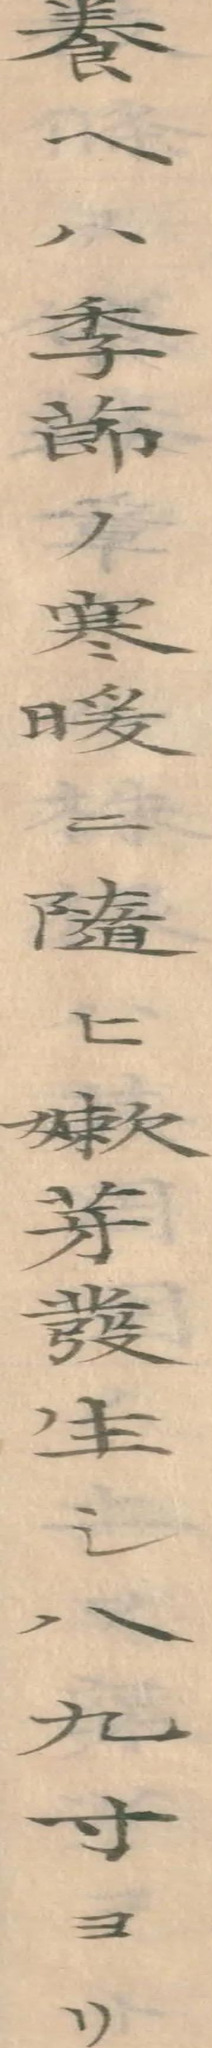養ヘハ季節ノ寒暖ニ随ヒ嫩芽発生シ八九寸ヨリ
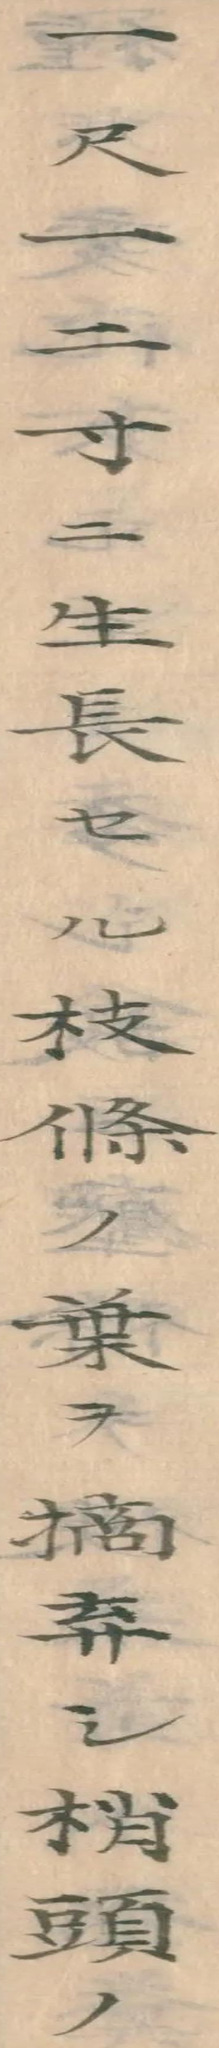一尺一二寸ニ生長セル枝条ノ葉ヲ摘棄シ梢頭ノ
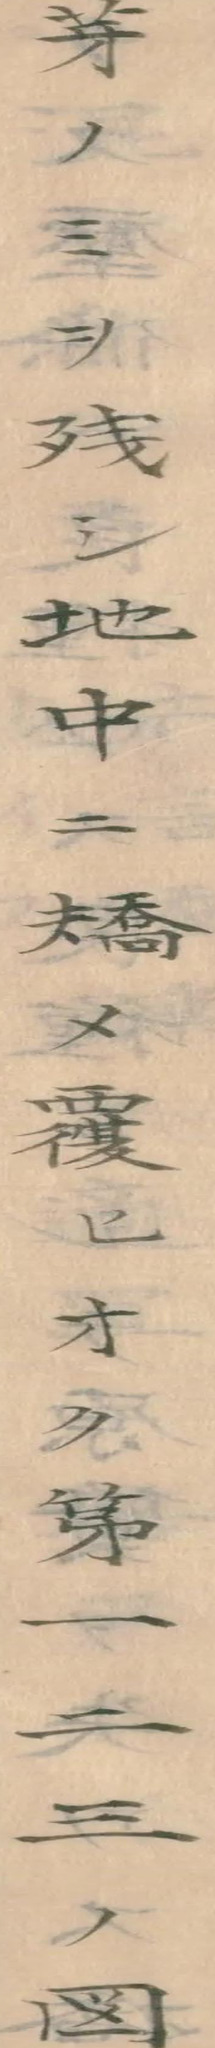芽ノミヲ残シ地中ニ矯メ覆ヒオク第一二三ノ図
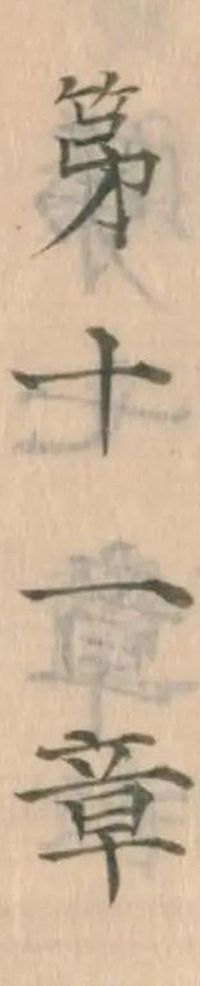第十一章
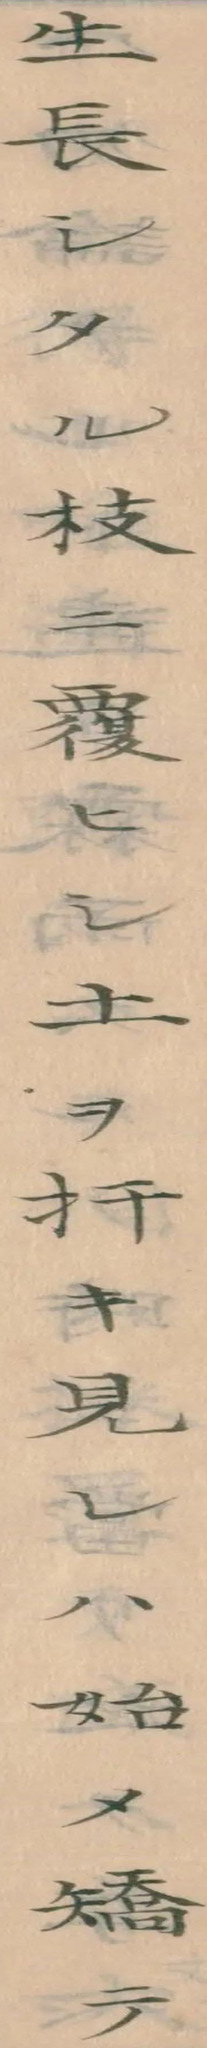生長シタル枝ニ覆ヒシ土ヲ扞キ見レハ始メ矯テ
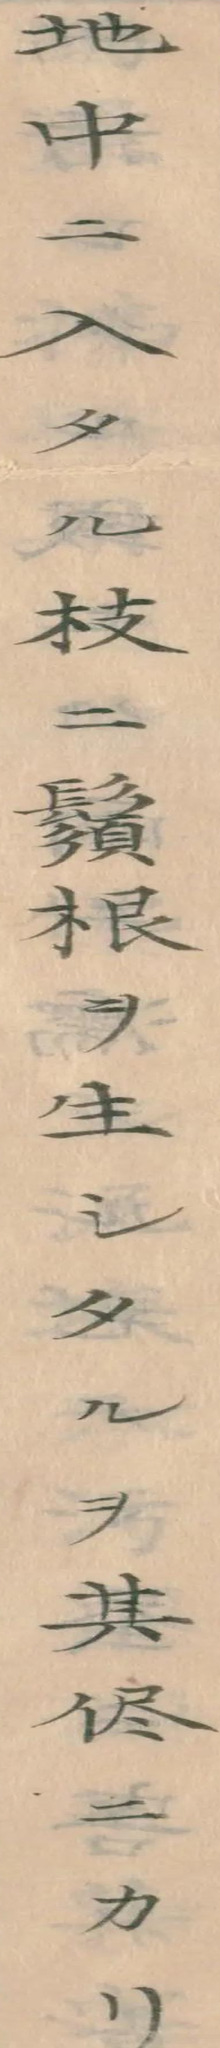地中ニ入タル枝ニ鬚根ヲ生シタルヲ其侭ニカリ
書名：蚕桑集成
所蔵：国立国会図書館 National Diet Library, JAPAN
